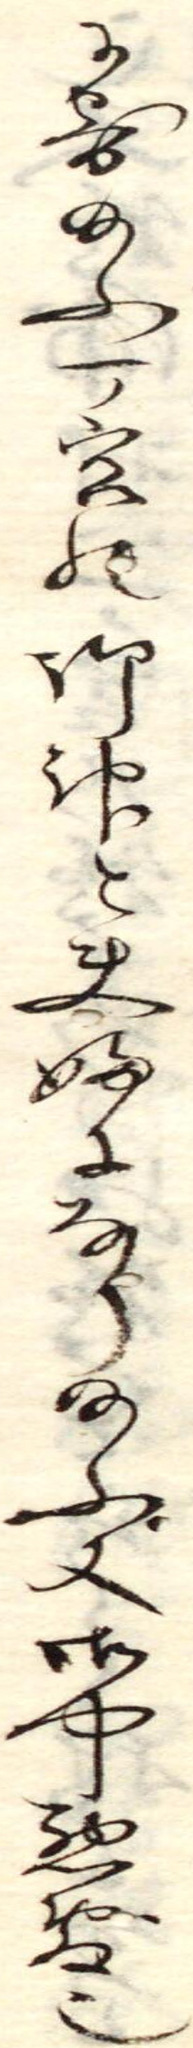に寄給ふ一ノ宮の御神と夫婦になり給ふ又御中悪敷也
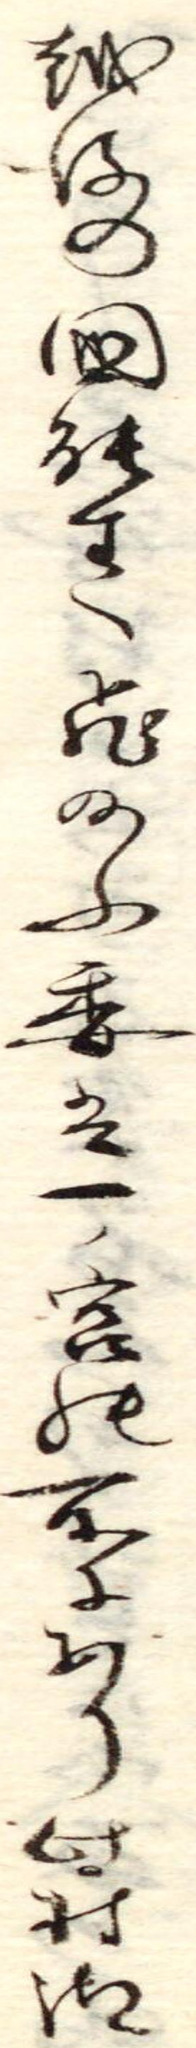越後の国能生へ飛給ふ委は一ノ宮の所にあり此村御
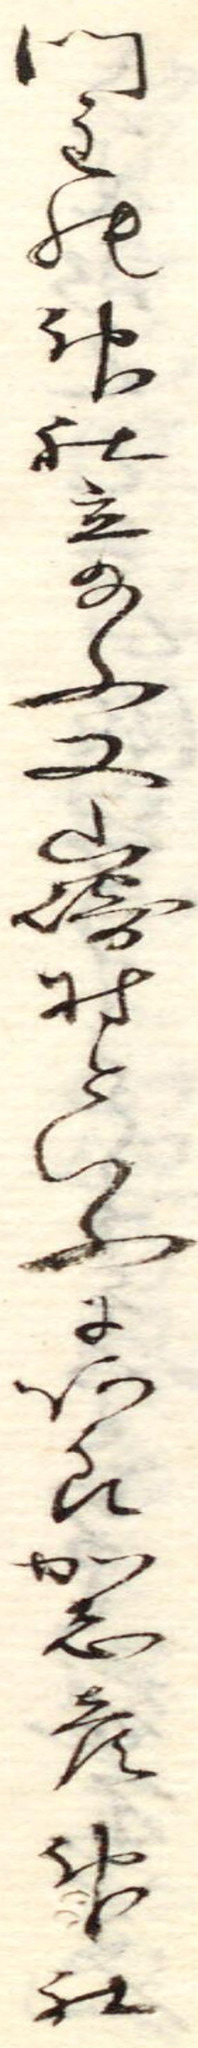門主の神社立給ふ又山崎村といふに阿良加志彦神社
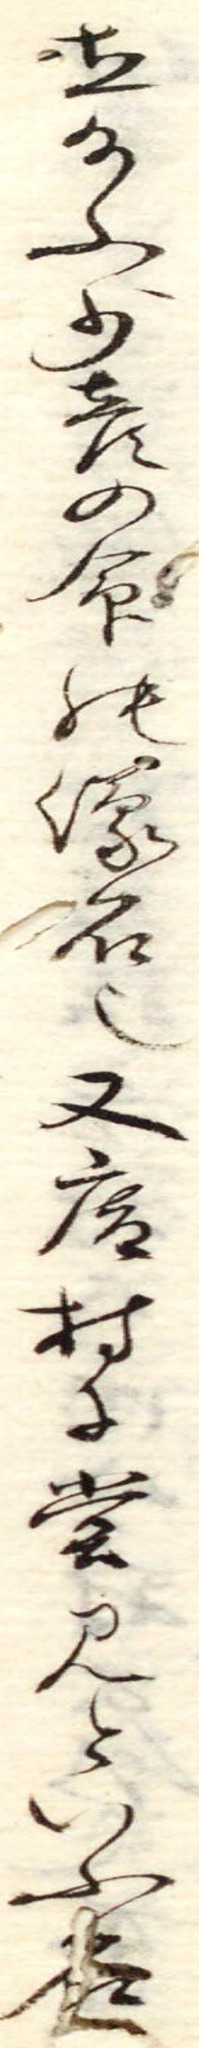立給ふ少彦の命の像石也又庵村に賞見といふ石
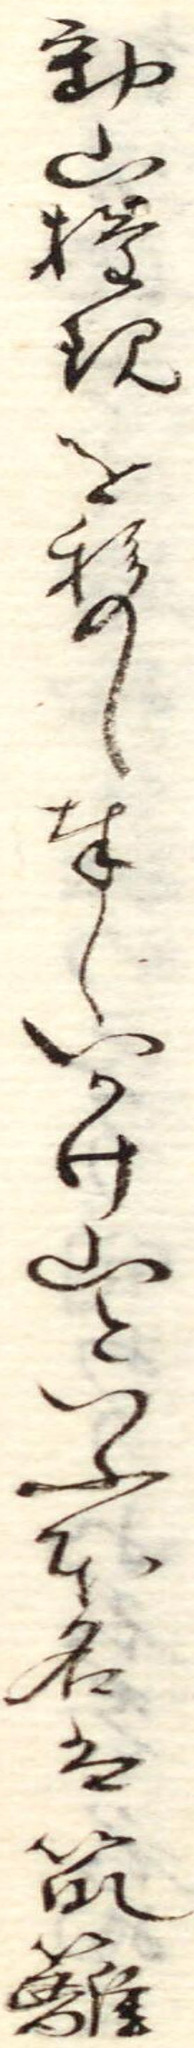動山権現を移し奉しいかけ山といふ本名は笊籬
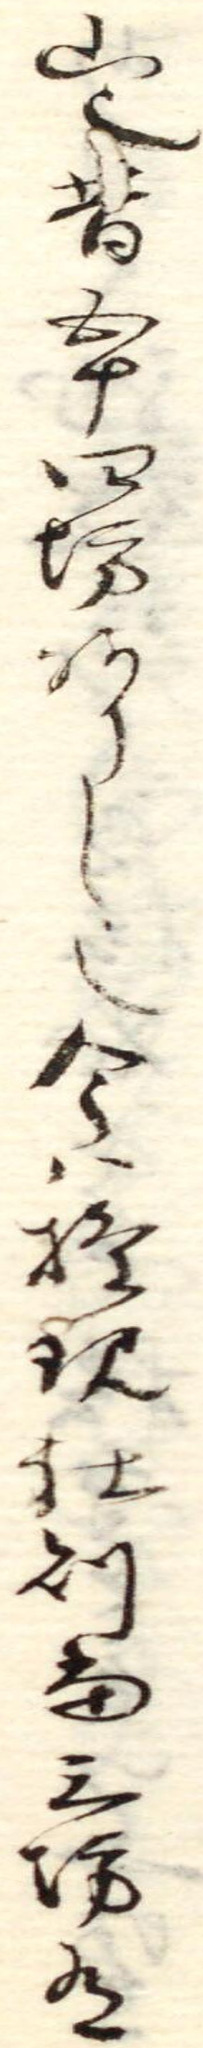山也昔五十四坊ありし也今は権現社則当三坊有
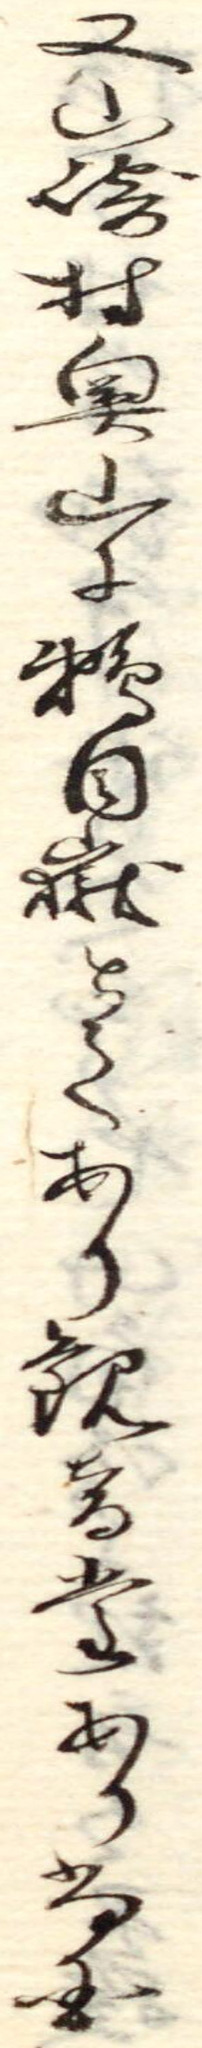又山崎村奥山に鵜目嶽とてあり観音堂あり当国
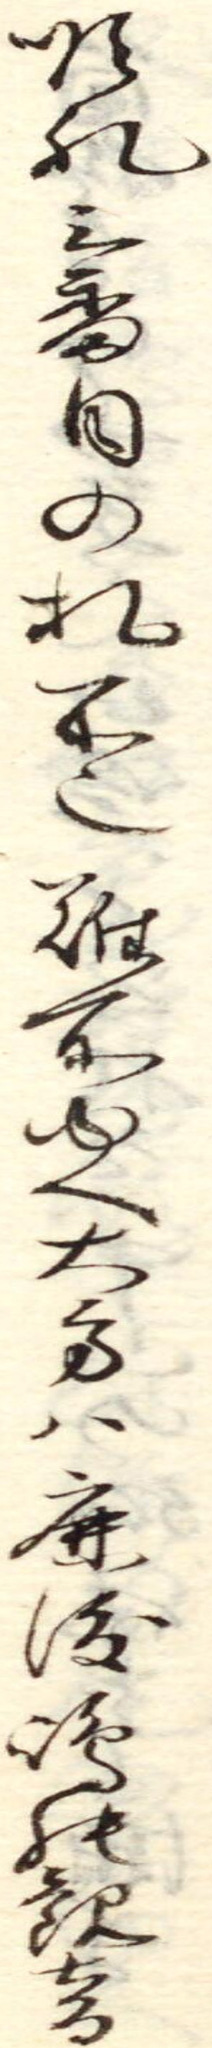順礼三番目の札所也難所ゆへ大方は鹿渡嶋の観音
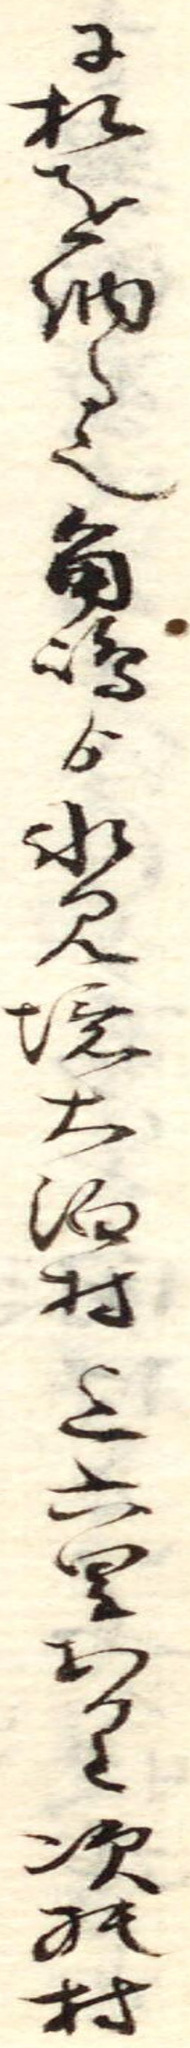に札を納る也角嶋ゟ氷見境大泊村迄六里あり須能村
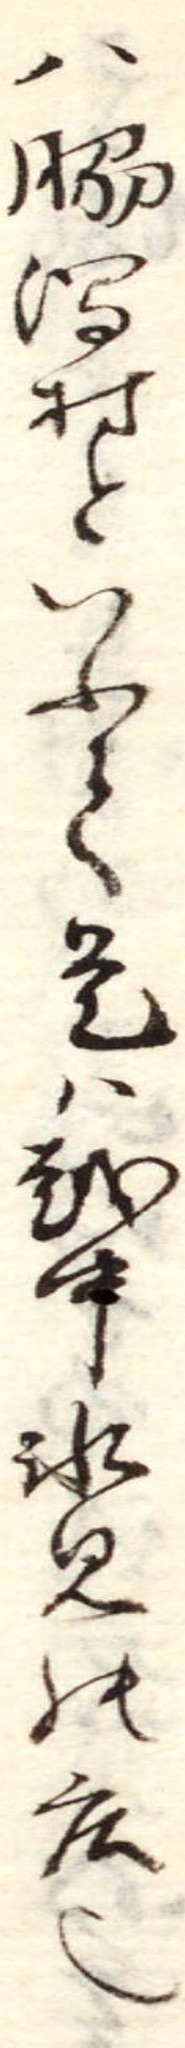は脇瀉村といふて是は越中氷見の庄也
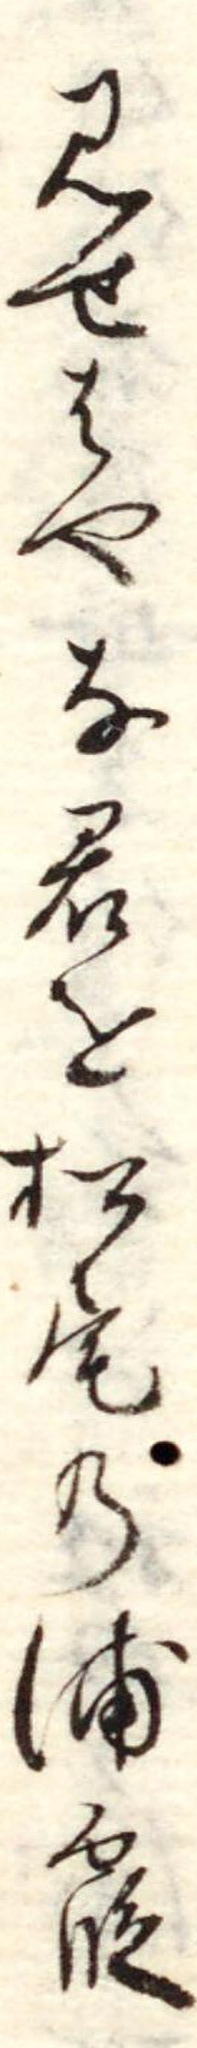見せはやな君を松尾の浦霞
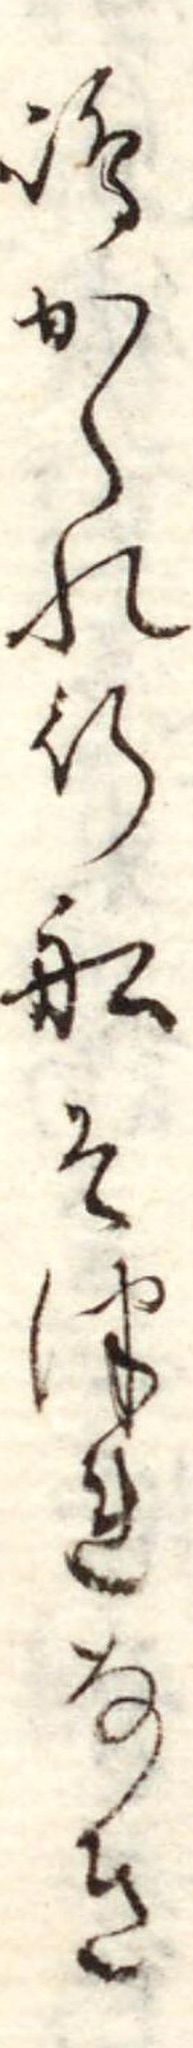嶋かくれ行船そつれなき
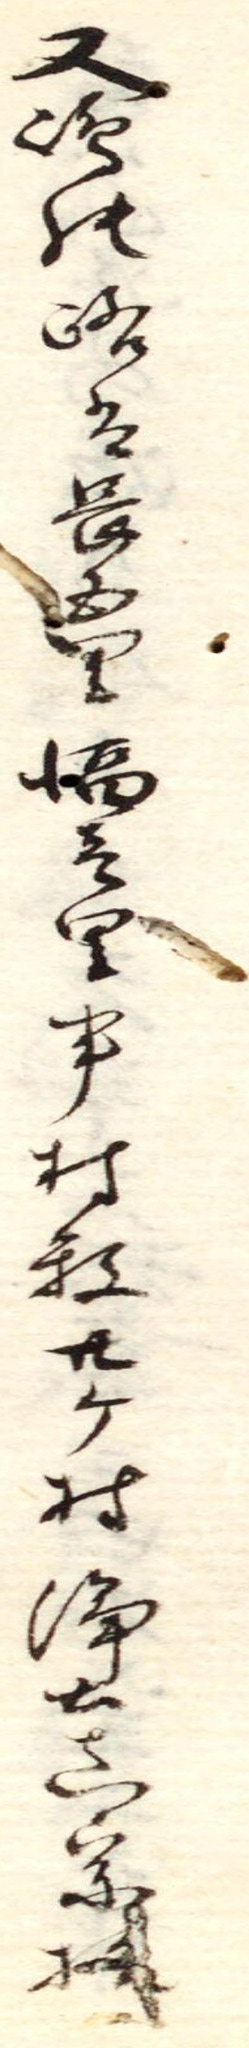又嶋の路は長五里幅壱里半村数廿ヶ村浄土宗拾
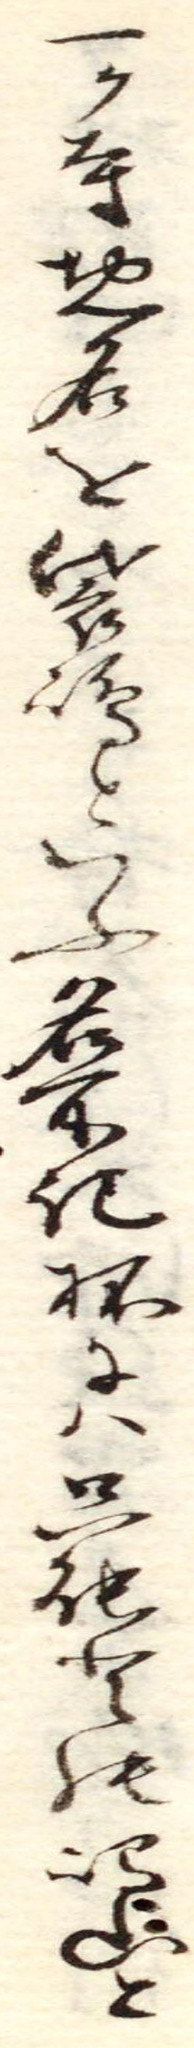一ヶ寺惣名を袋嶋といふ名所記抔には只能登の嶋山と
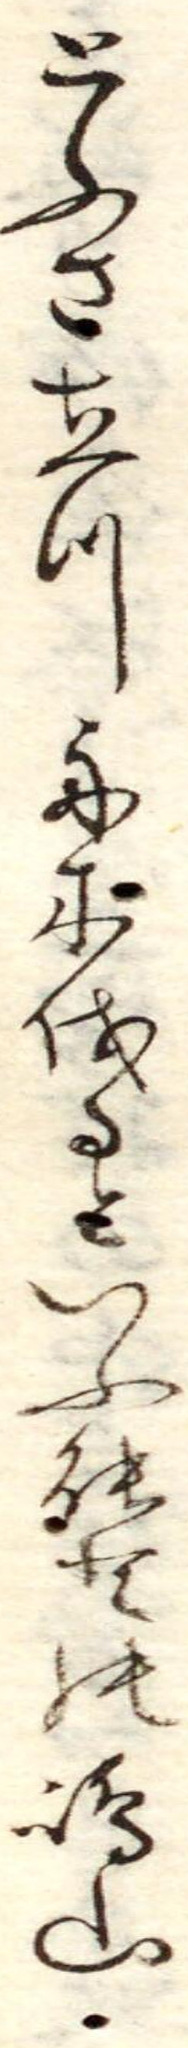とふさ立つ舟木伐るといふ能登の嶋山
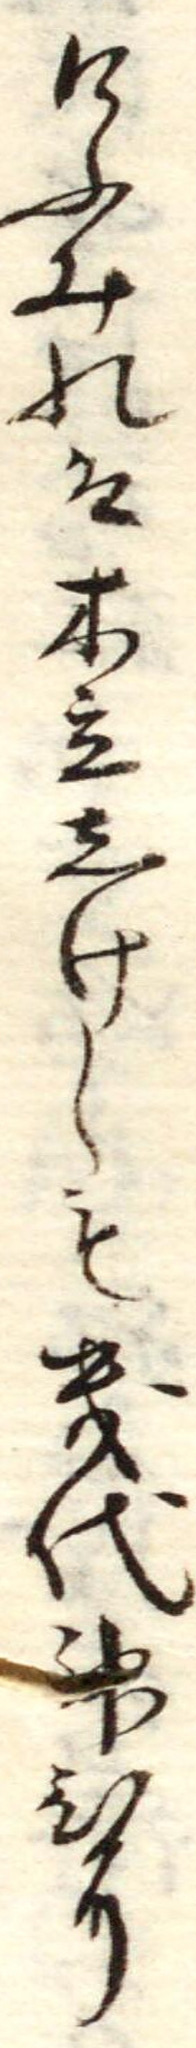けふみれは木立しけしも幾代神ひそ
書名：能登名跡誌
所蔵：Ishikawa Prefectural Library
